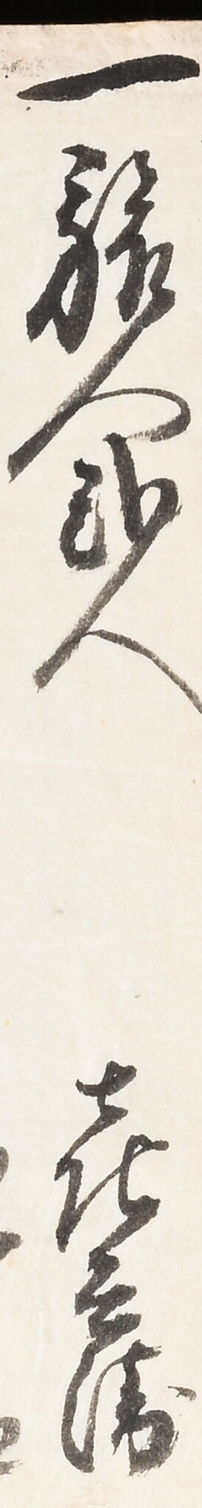一旅人弐人喜兵衛
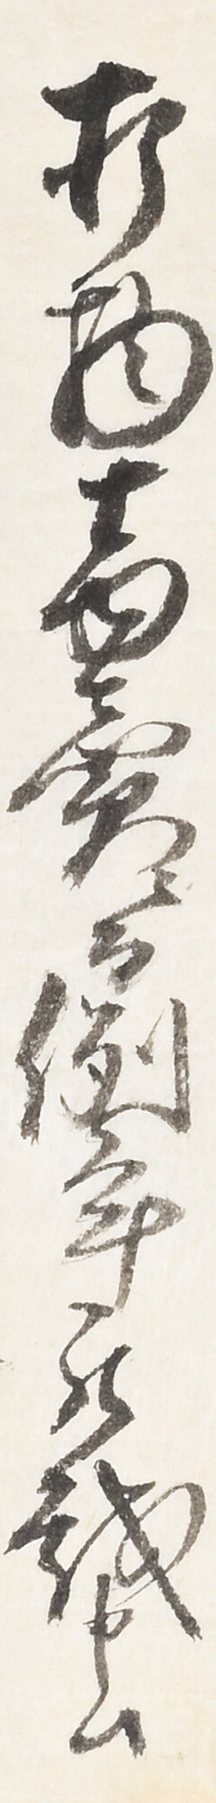打物商売ニ而例年罷越申候
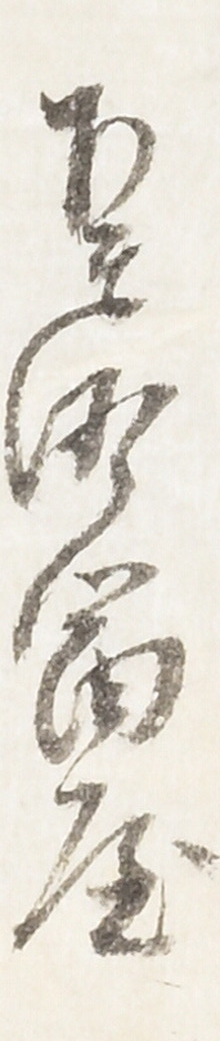下モ町冨屋
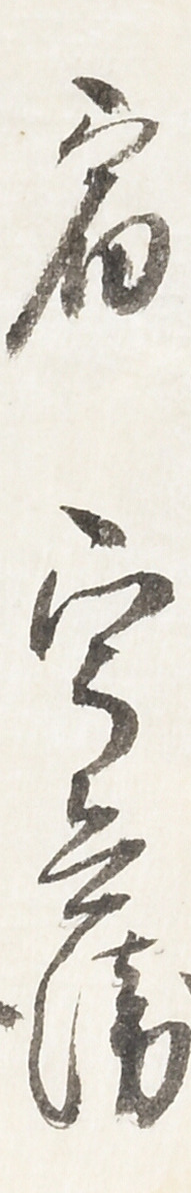宿宇兵衛
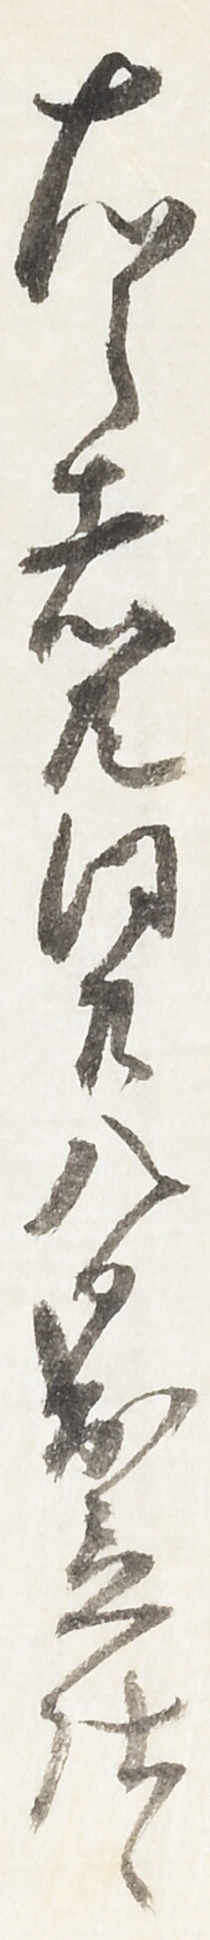右之者共同廿八日出立仕候
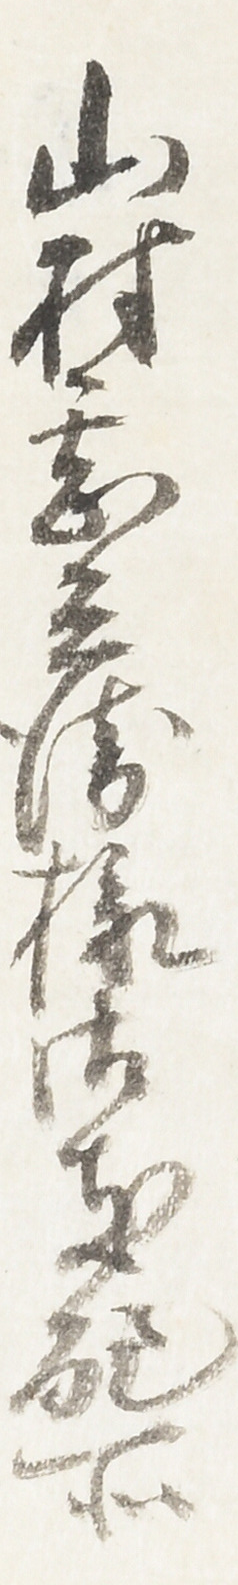山村甚兵衛様御支配所
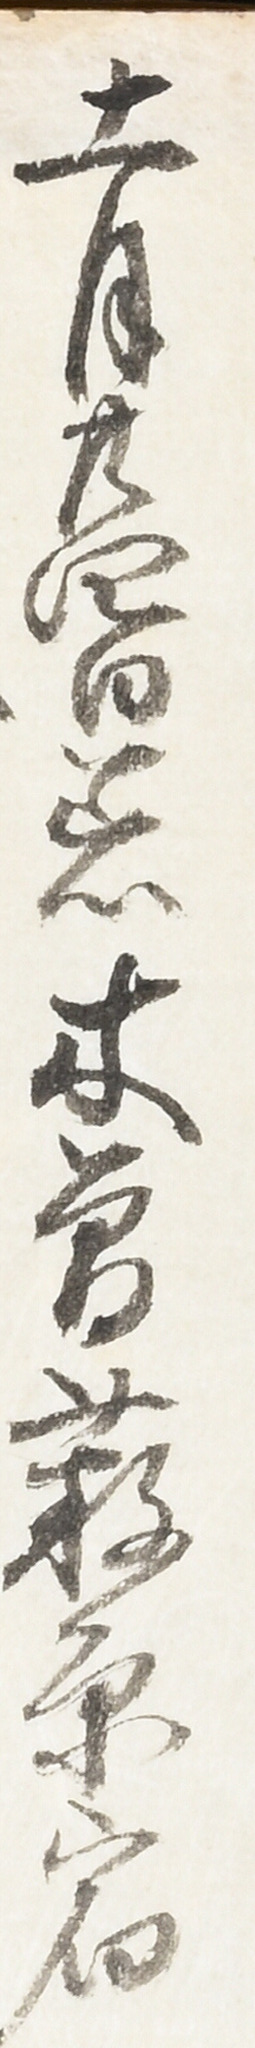十一月廿四日着木曽藪原宿
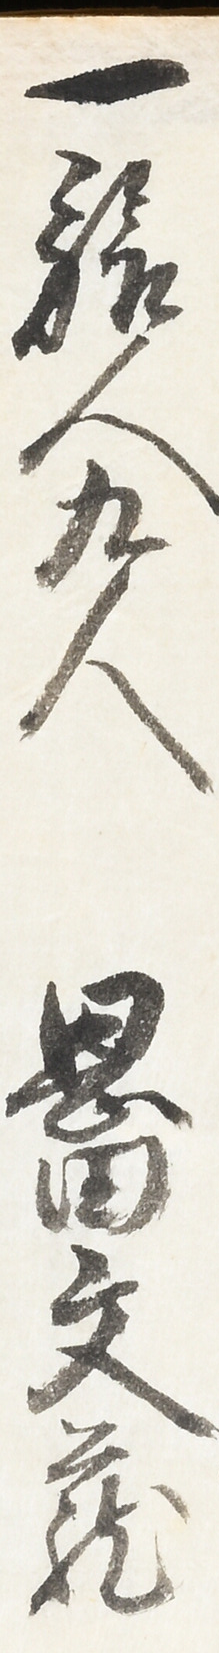一旅人九人恩田文蔵
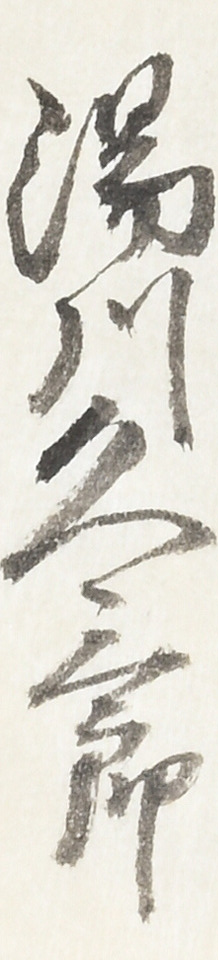湯川久三郎
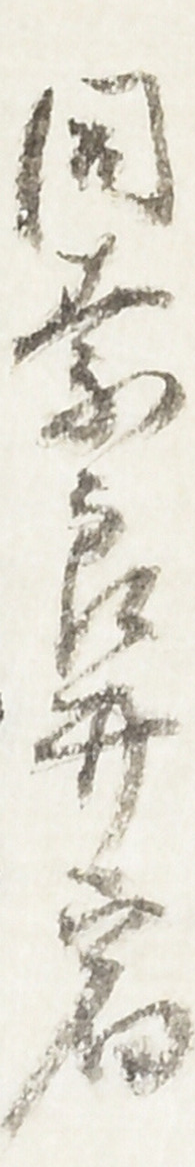同奈良井宿
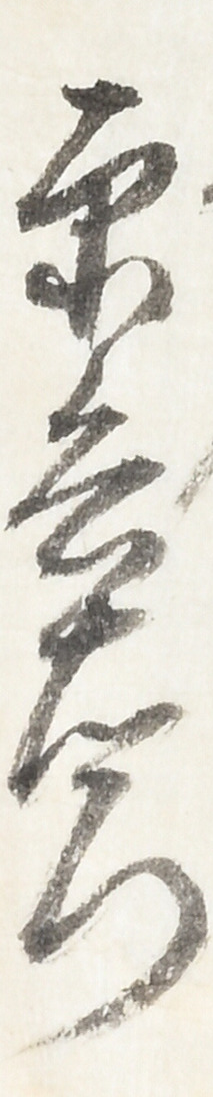原兵右衛門
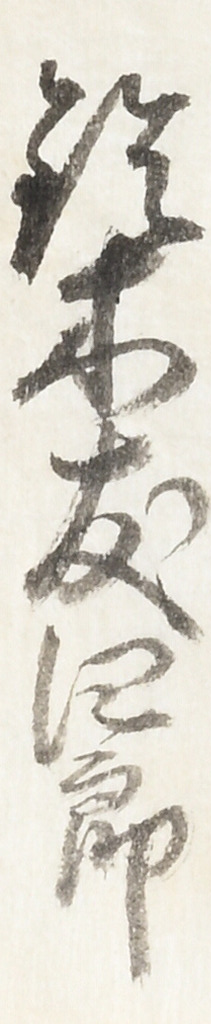鈴木友四郎

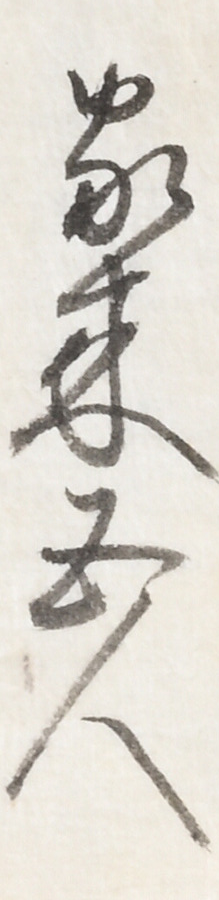家来五人
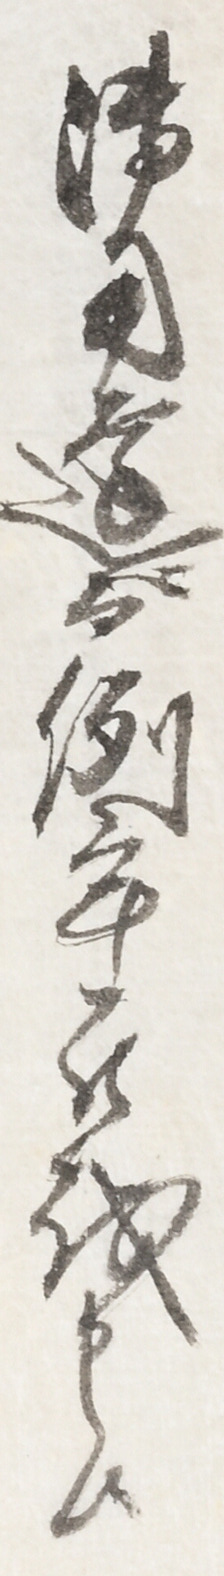御用達ニ而例年罷越申候
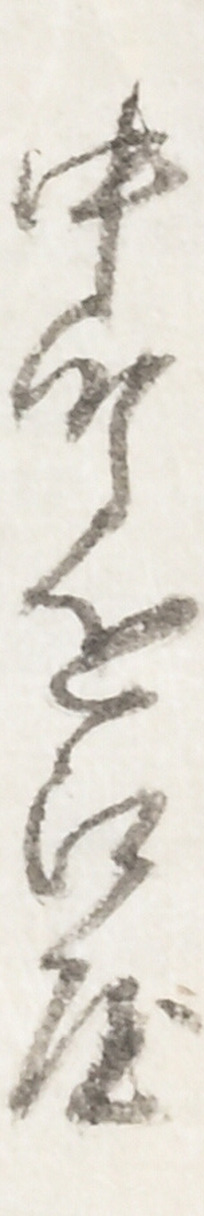中町近江屋
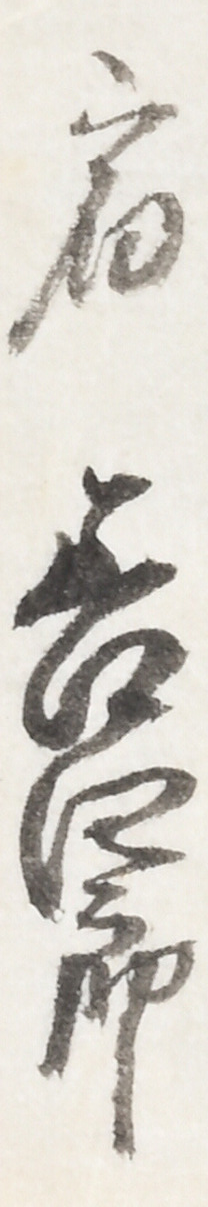宿善四郎
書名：旅人泊控帳
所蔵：伊那市立高遠町図書館・合同会社AMANE
